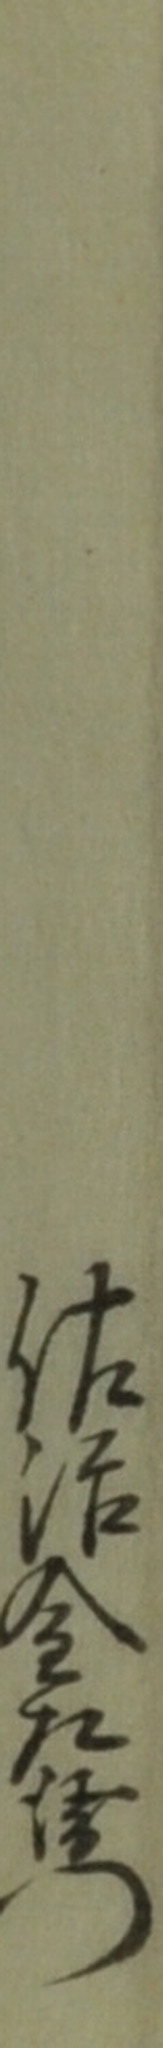佐治金左衛門
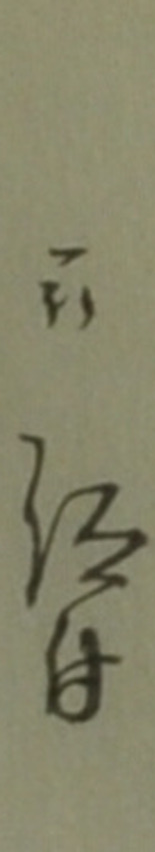被仰付
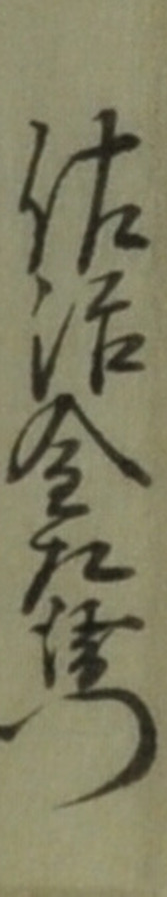佐治金左衛門
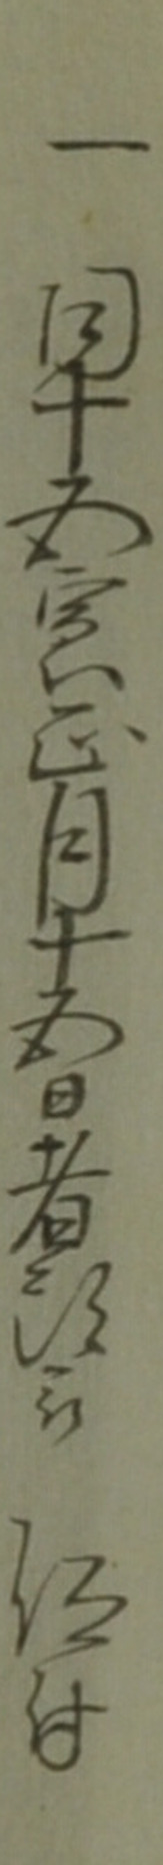一同十五寅正月十五日者頭被仰付
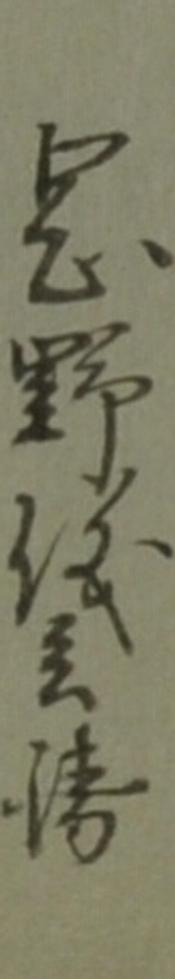岡野儀兵衛
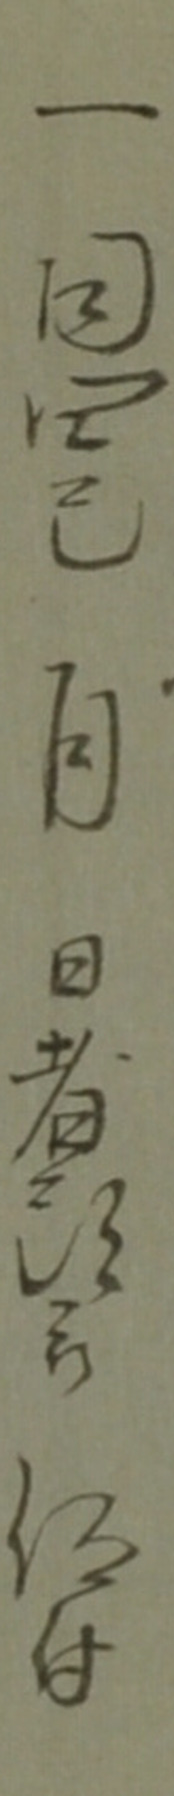一同四巳月日者頭被仰付
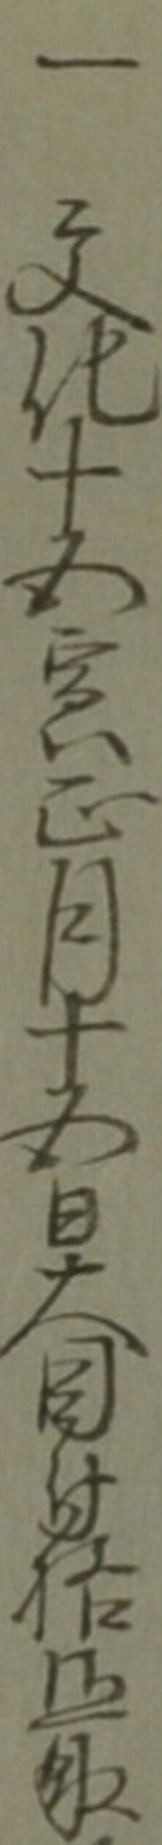一文化十五寅正月十五日大目付格御取次ゟ
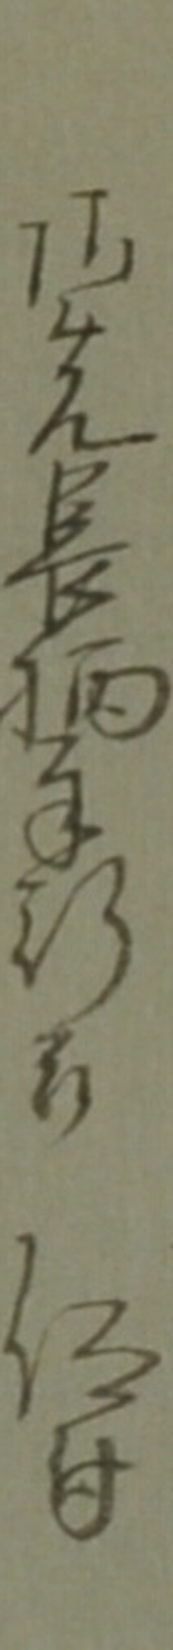御先長柄奉行被仰付
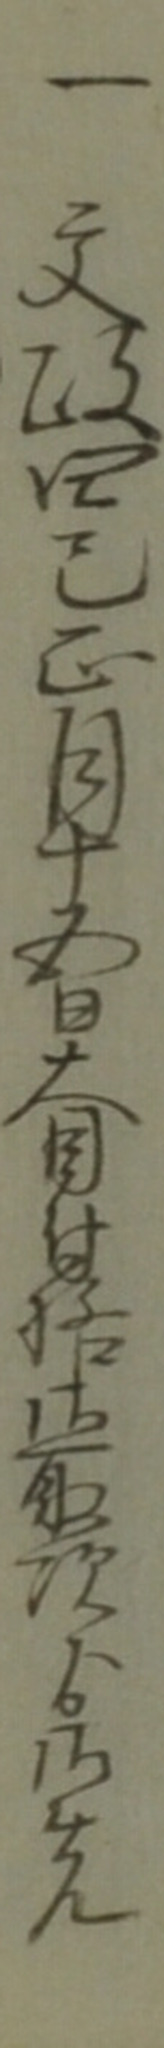一文政四巳正月十五日大目付格御使取次ゟ御先
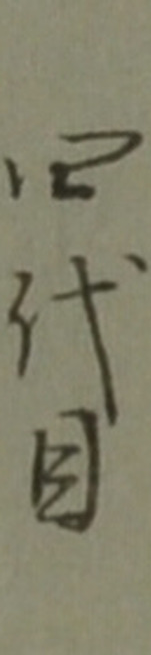四代目
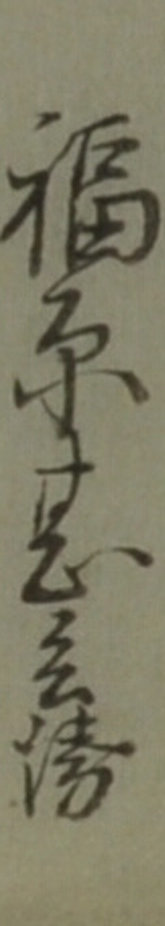福原甚兵衛
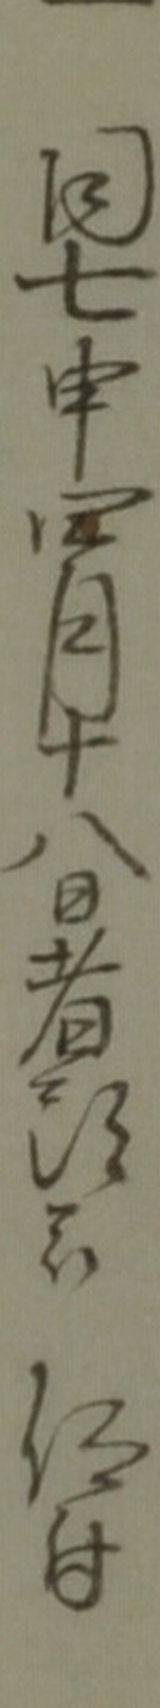一同七申四月十八日者頭被仰付
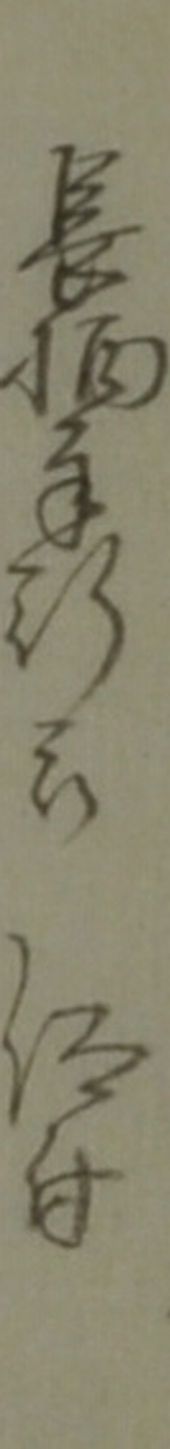長柄奉行被仰付
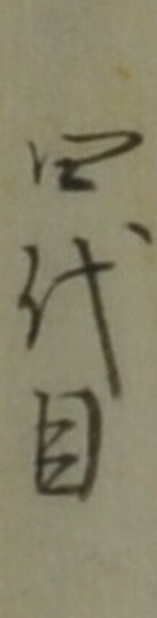四代目
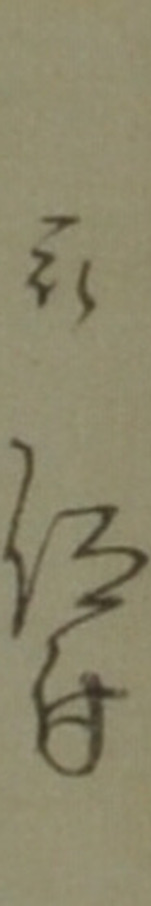被仰付
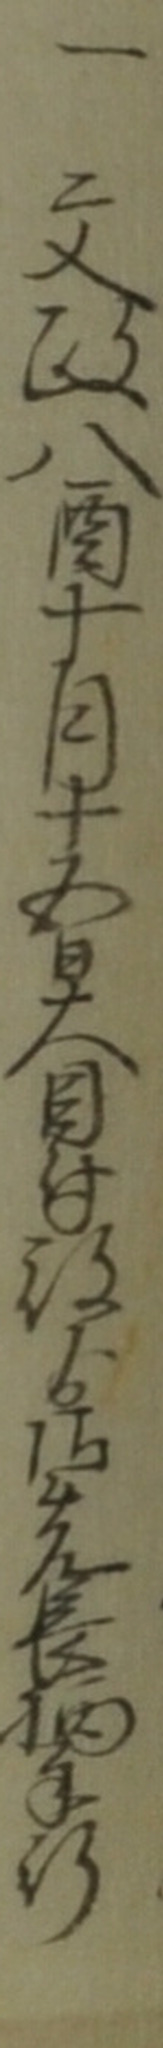一文政八酉十月十五日大目付役ゟ御先長柄奉行
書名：諸御役代々録（三）
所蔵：伊那市立高遠町図書館・合同会社AMANE
